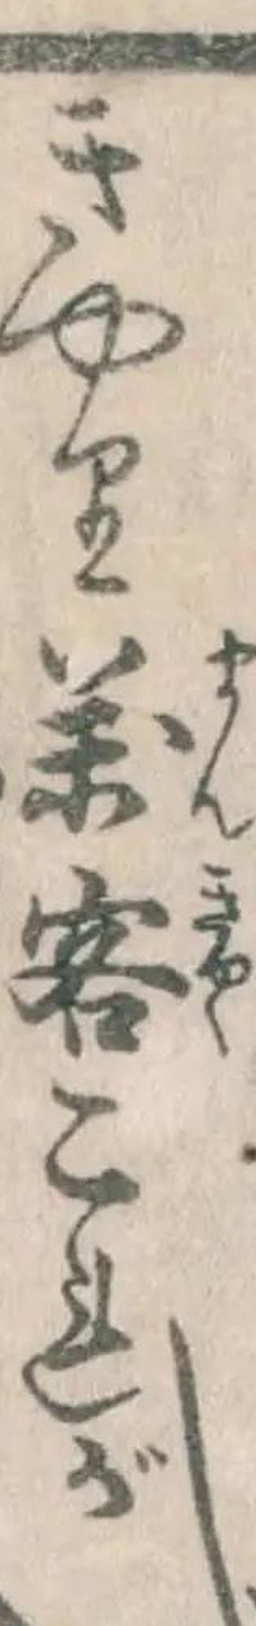きやり万客これが
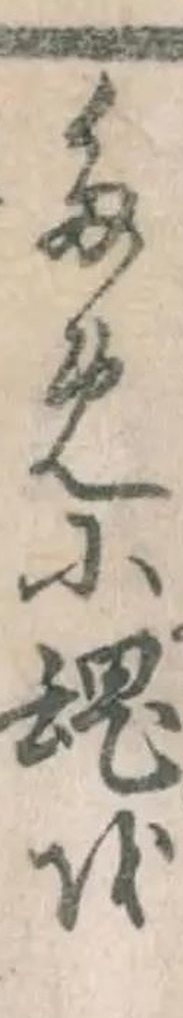ために魂を
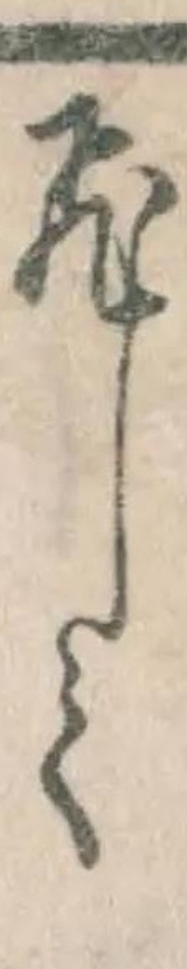飛して
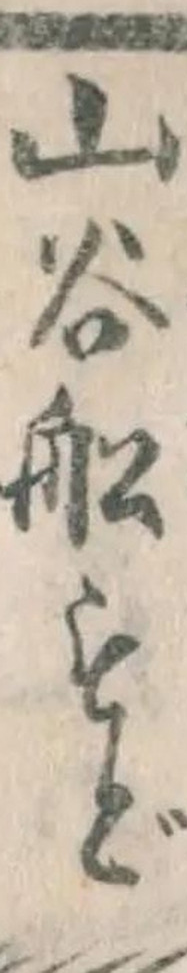山谷船もど
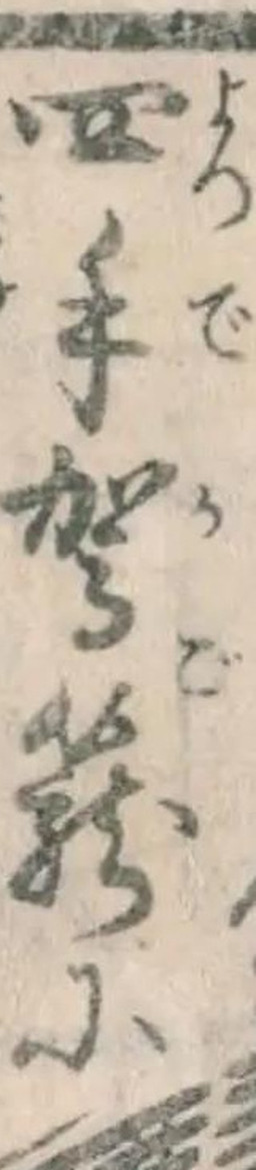四手駕籠に
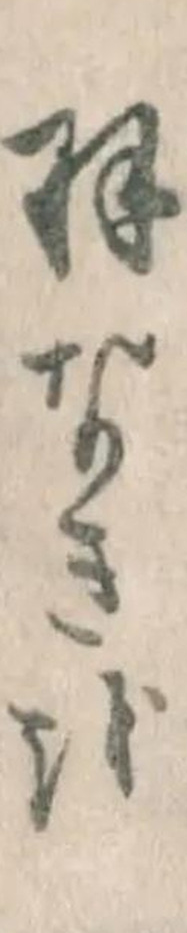羽なきを
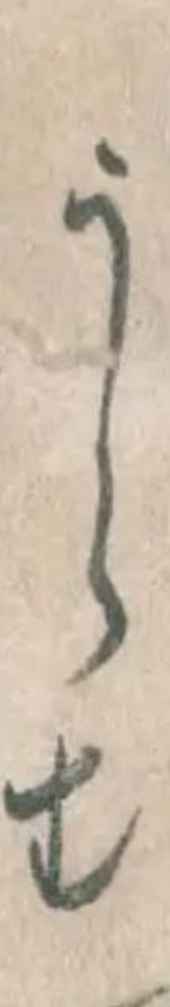うらむ

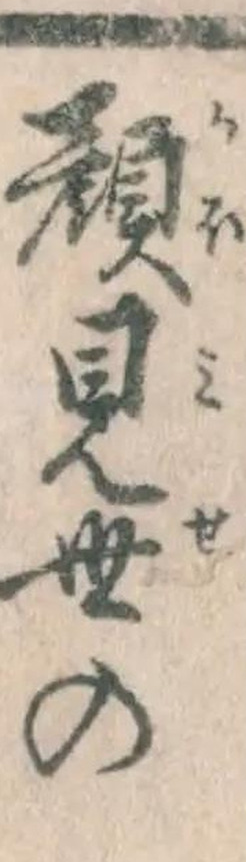顔見世の
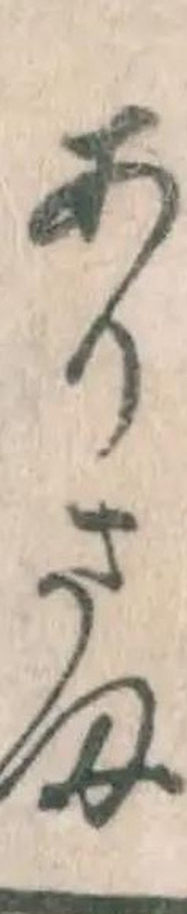ありさま
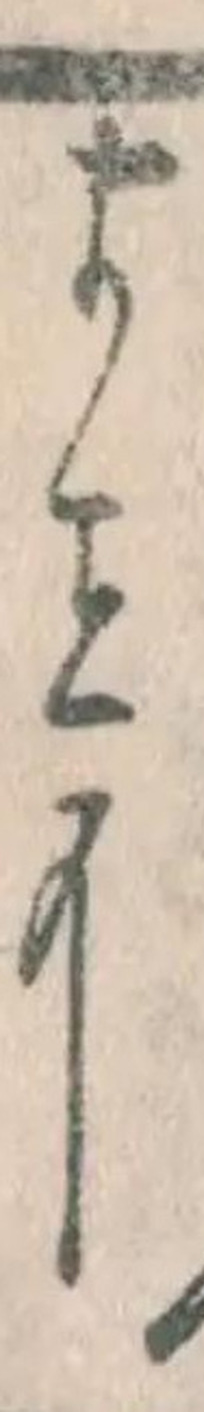まことに
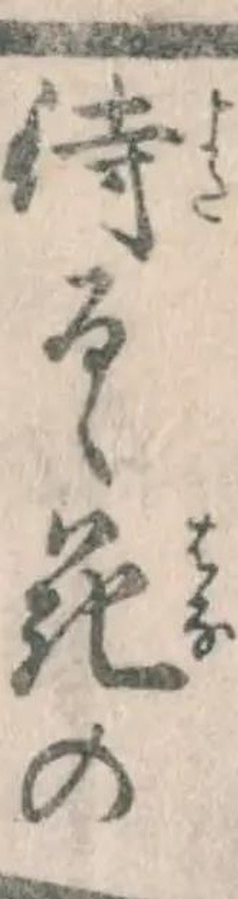待るゝ花の
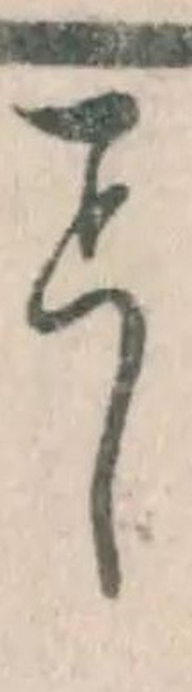ことし
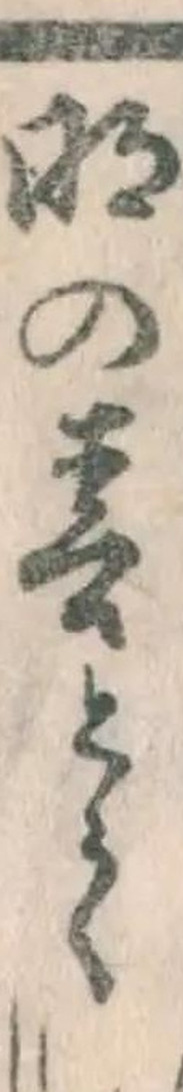明の春とて
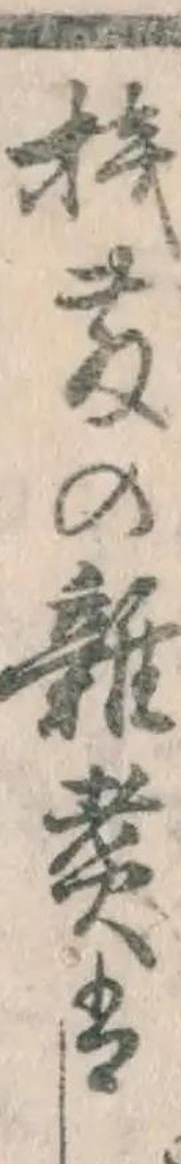桟敷の雑煮は
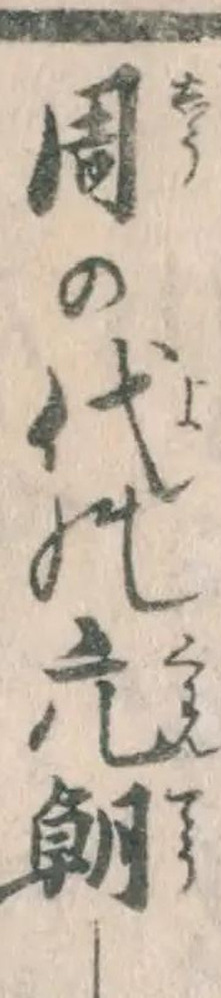周の代の元朝
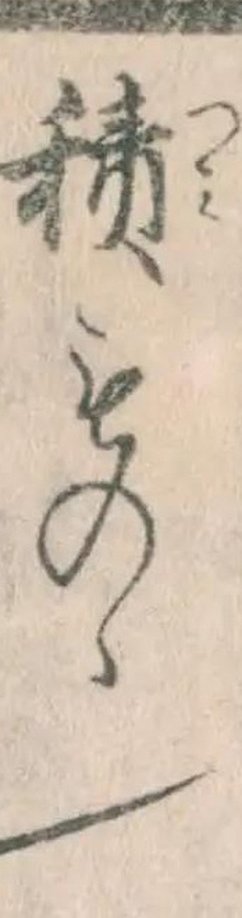積ものゝ
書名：絵本物見岡
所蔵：国立国会図書館 National Diet Library, JAPAN
